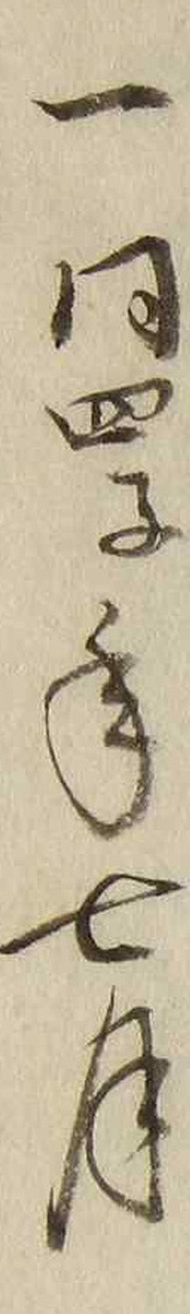一同四子年七月

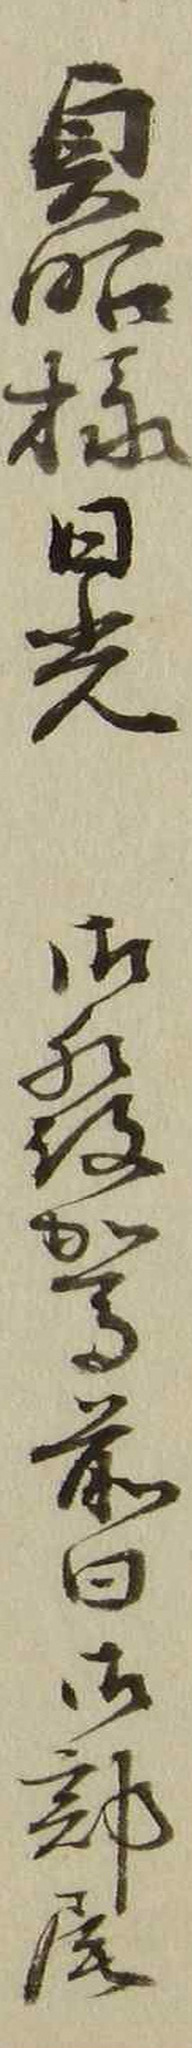貞昭様日光御発駕前日御部屋
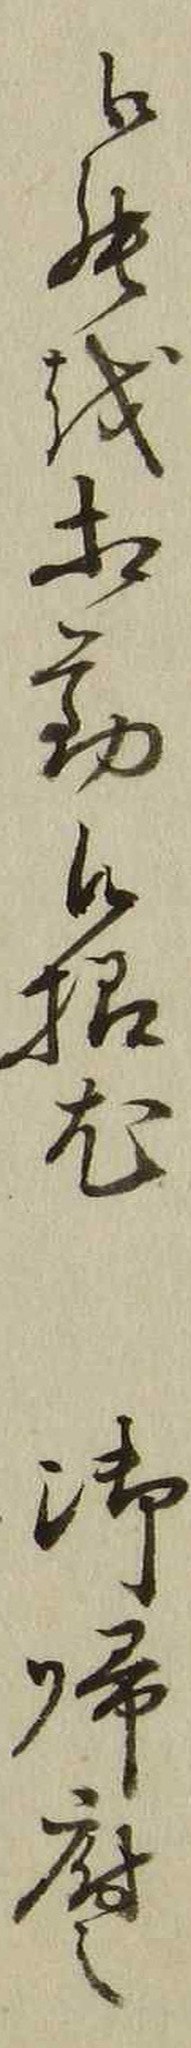江罷越相勤候様尤御帰府之
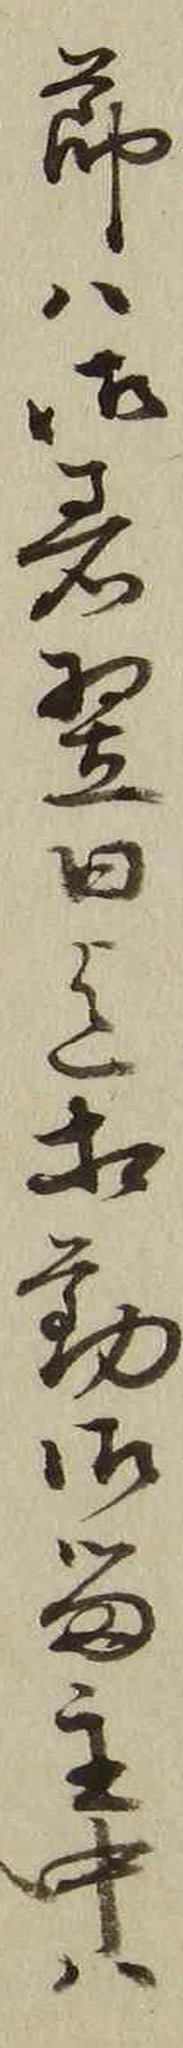節ハ御着翌日迄相勤御留守中ハ
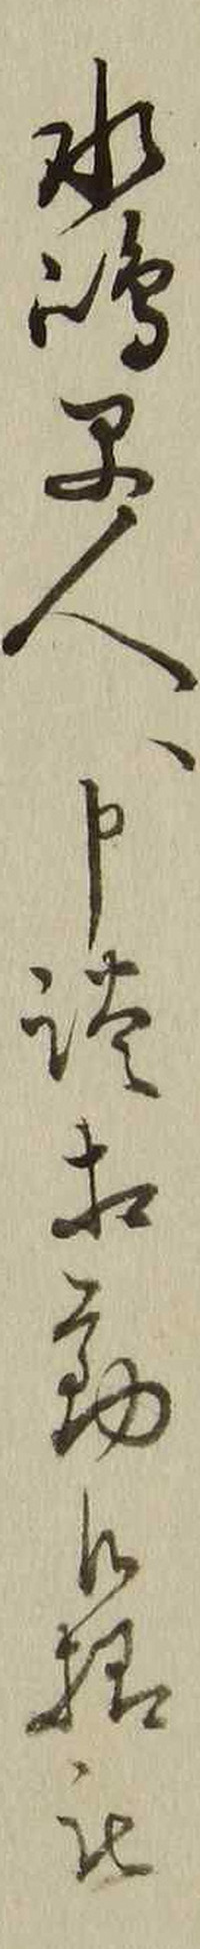水島早人へ申談相勤候様被
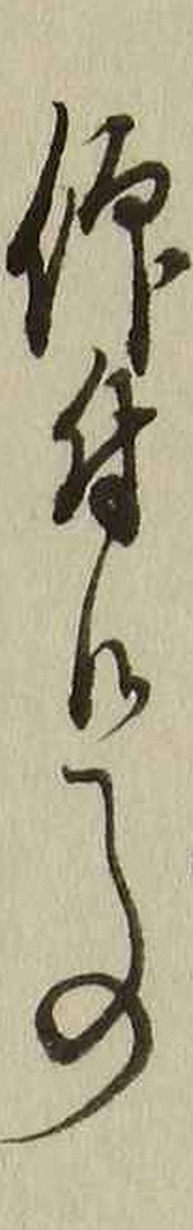仰付候事
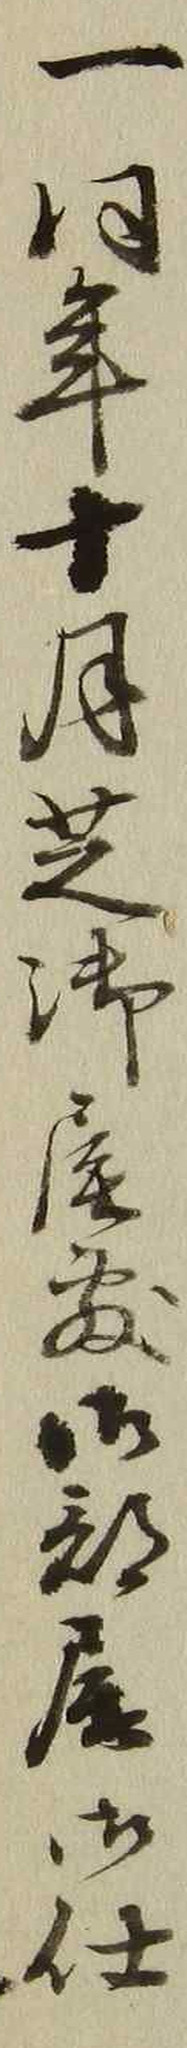一同年十月芝御屋敷御部屋御仕
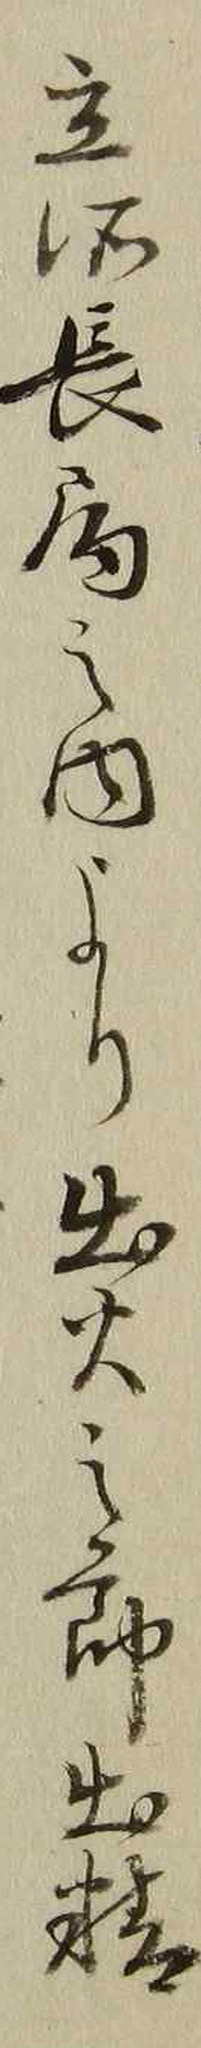立所長局之内より出火之節出精
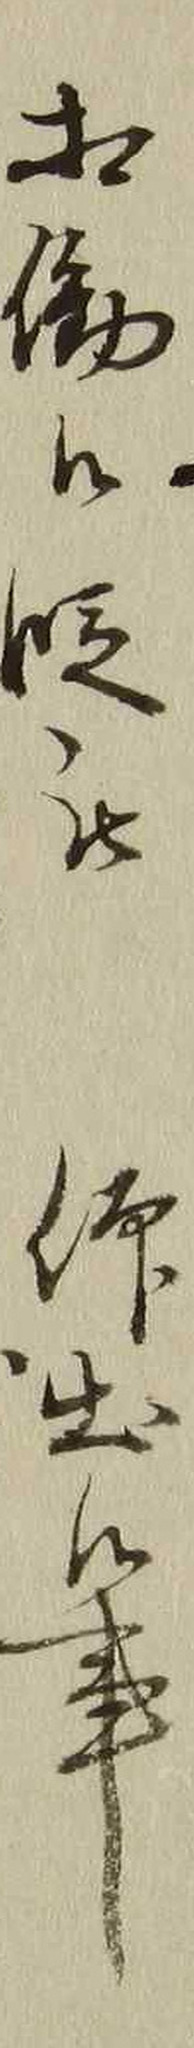相働候段被仰出候事
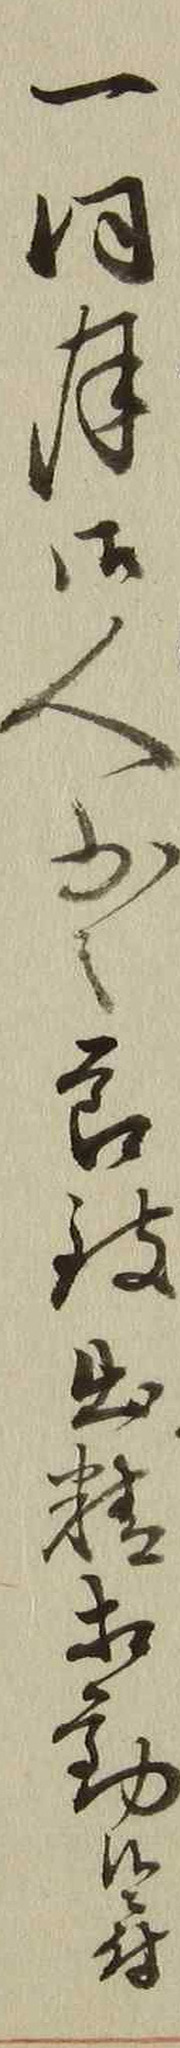一同月御人少之節致出精相勤候ニ付
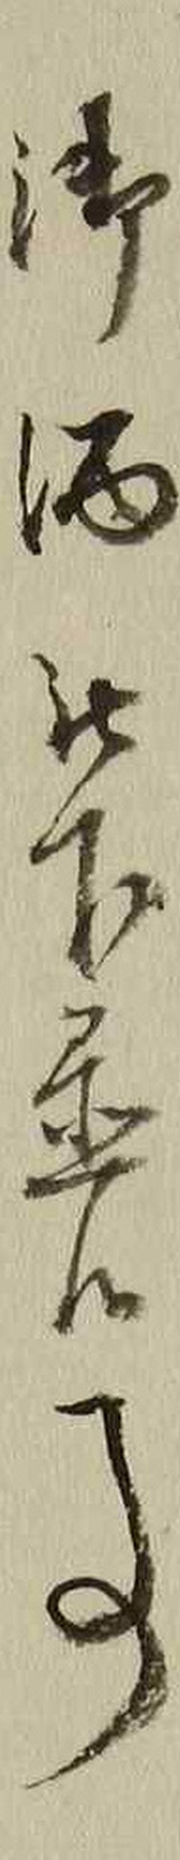御酒被下置候事
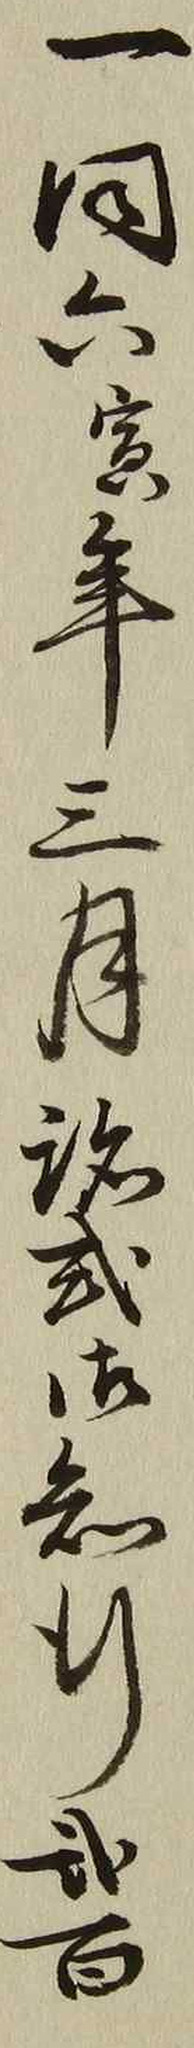一同六寅年三月跡式御知行弐百
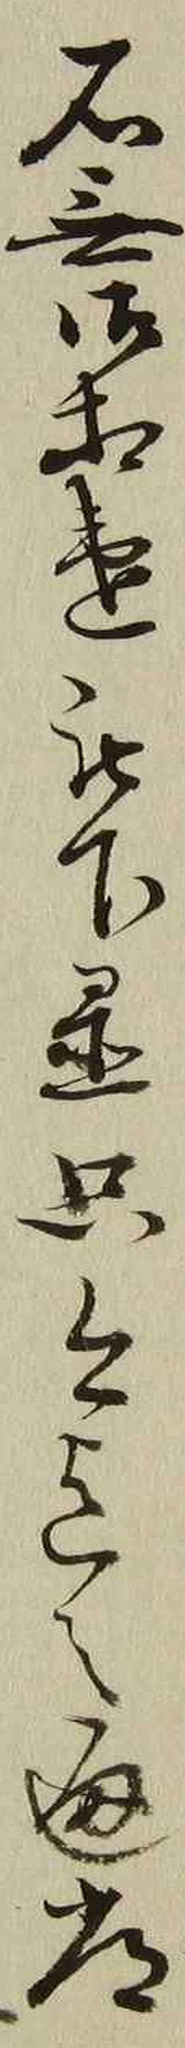石無御相違被下置只今迄之通常
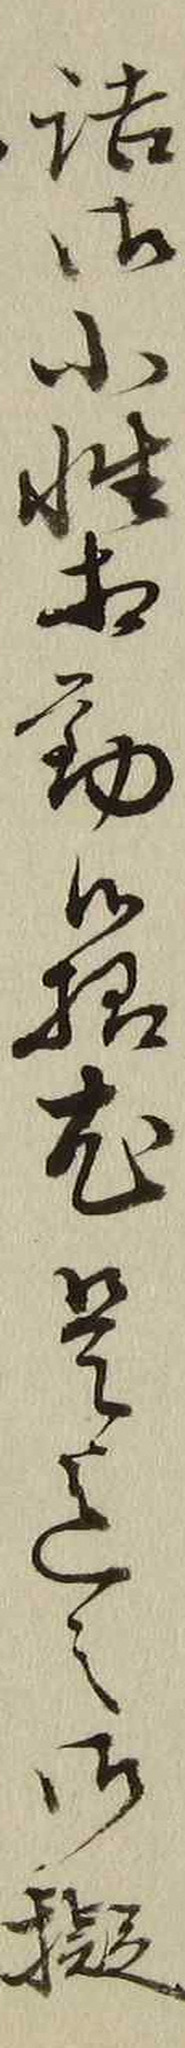詰御小性相勤候様尤是迄之御擬
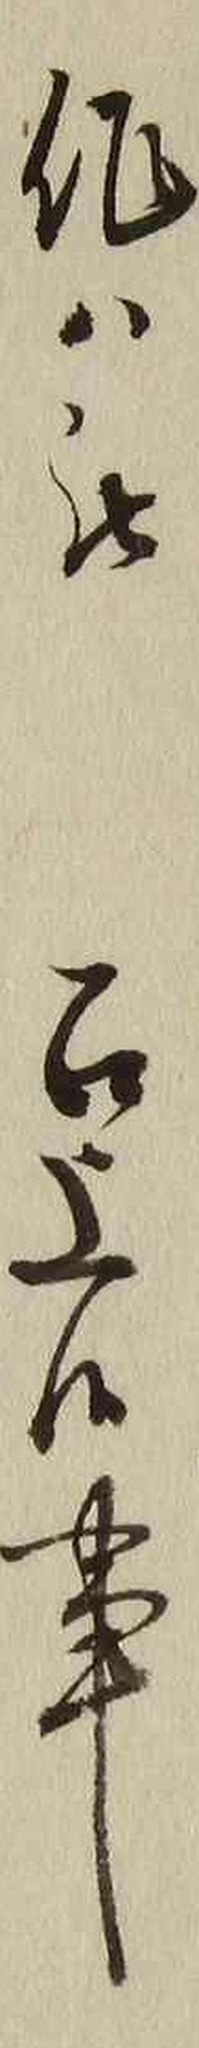作ハ被召上候事
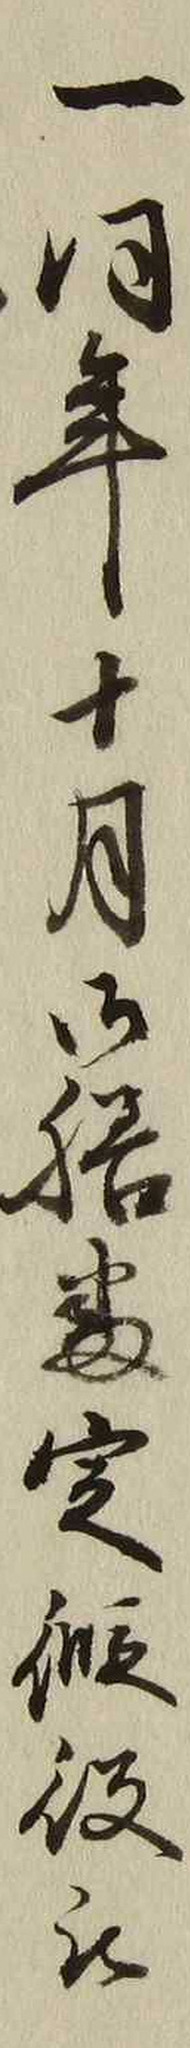一同年十月御膳番定仮役被
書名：諸士系譜　巻之35　は之部3
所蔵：会津若松市立会津図書館
